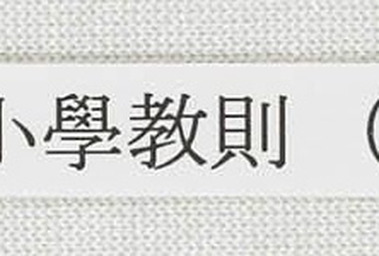小学教則
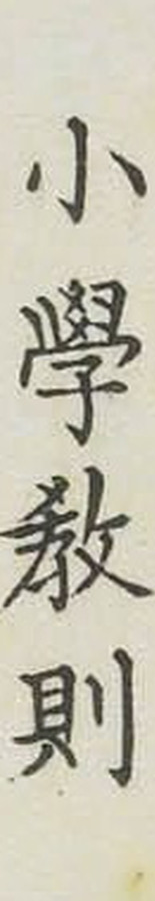小学教則
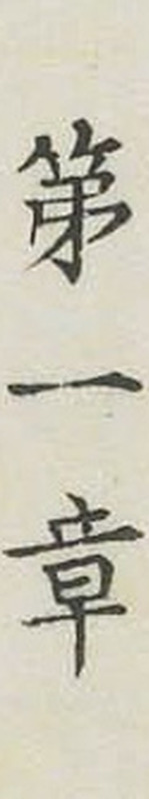第一章
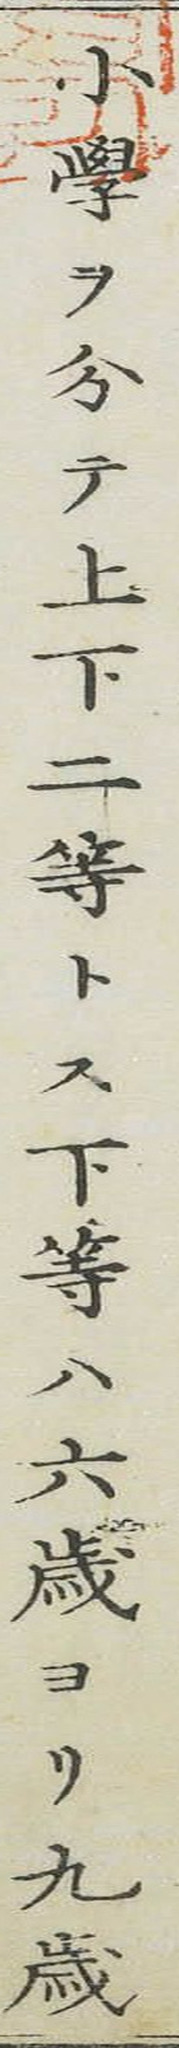小学ヲ分テ上下二等トス下等ハ六歳ヨリ九歳
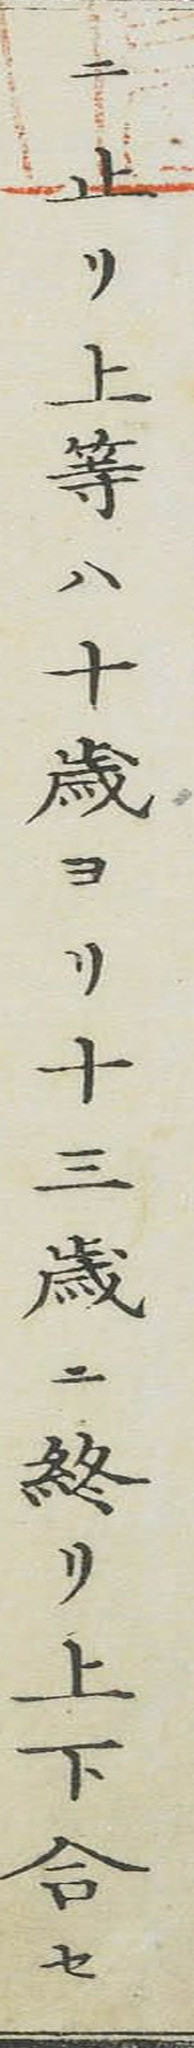ニ止リ上等ハ十歳ヨリ十三歳ニ終リ上下合セ
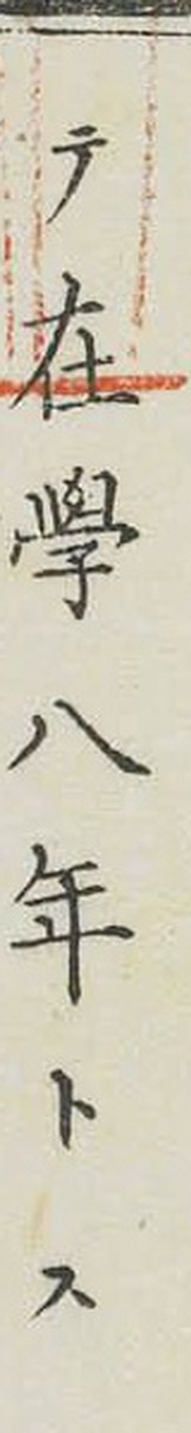テ在学八年トス
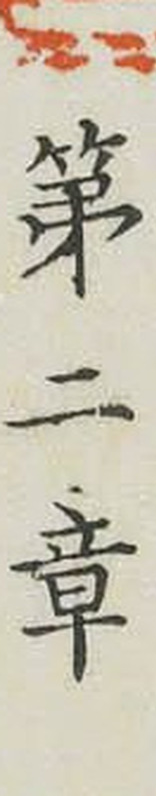第二章
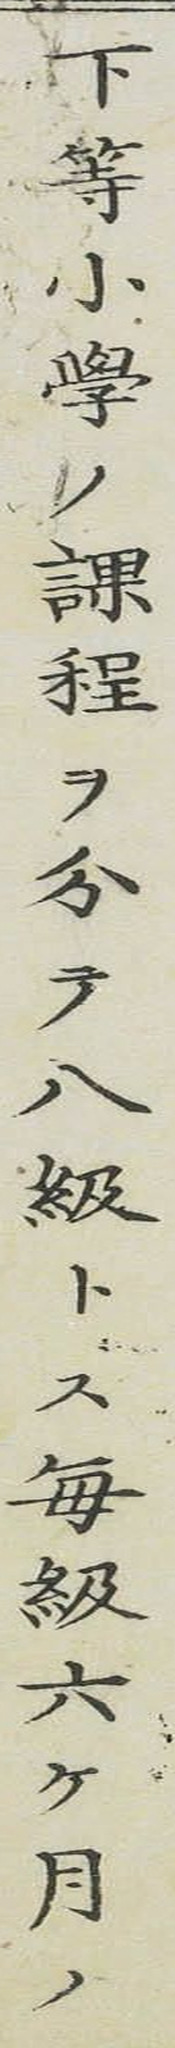下等小学ノ課程ヲ分テ八級トス毎級六ケ月ノ
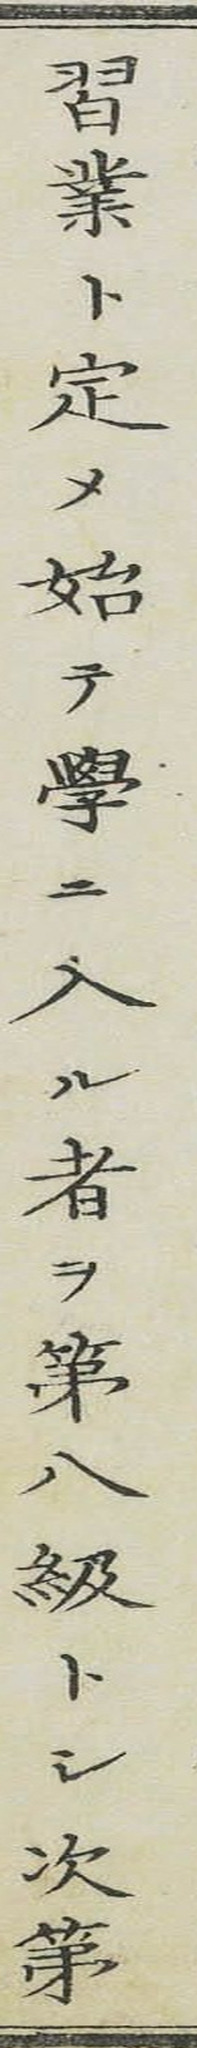習業ト定メ始テ学ニ入ル者ヲ第八級トシ次第
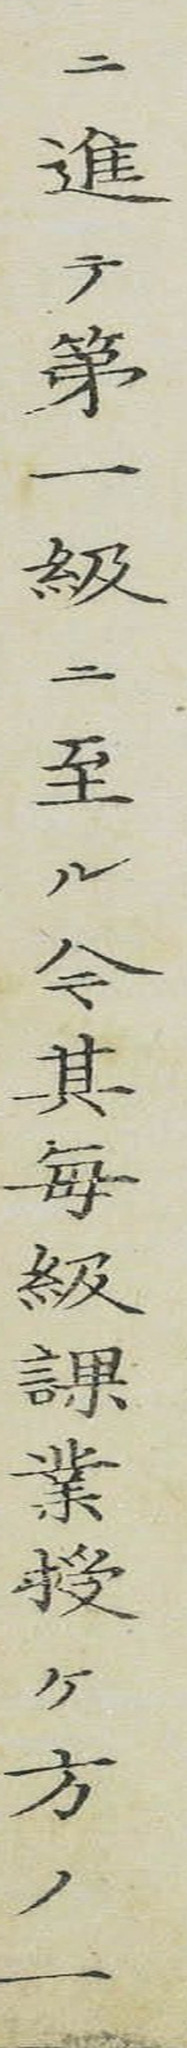ニ進テ第一級ニ至ル今其毎級課業授ケ方ノ一

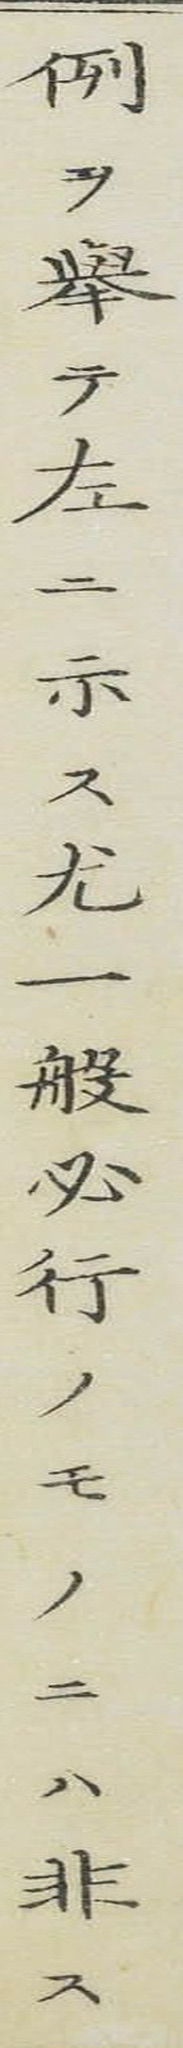例ヲ挙テ左ニ示ス尤一般必行ノモノニハ非ス
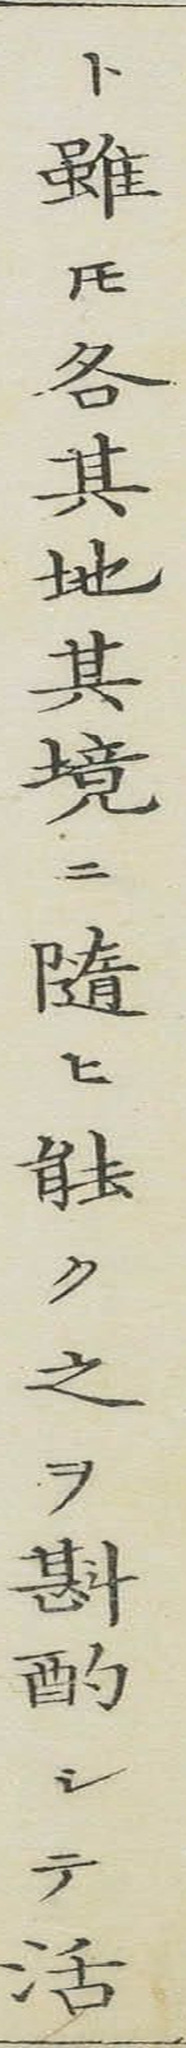ト雖モ各其地其境ニ随ヒ能ク之ヲ斟酌シテ活
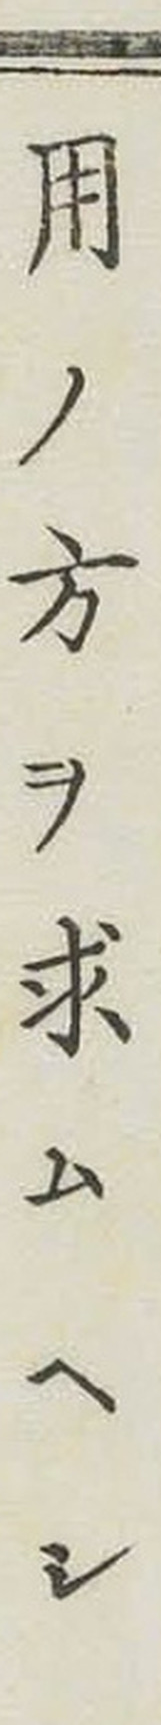用ノ方ヲ求ムヘシ
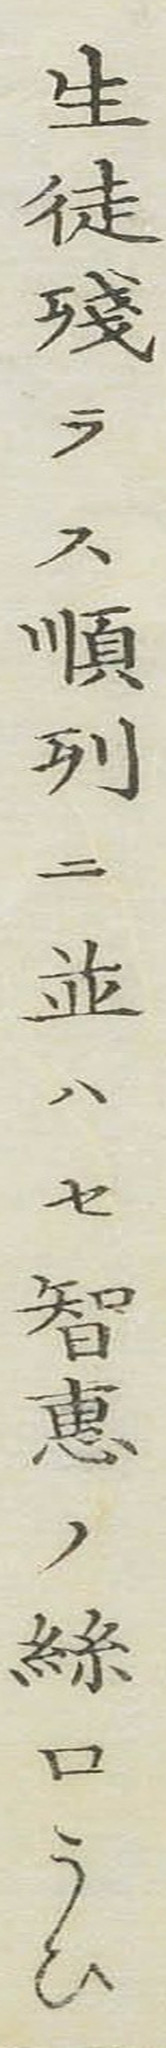生徒残ラス順列ニ並ハセ智恵ノ絲口うひ
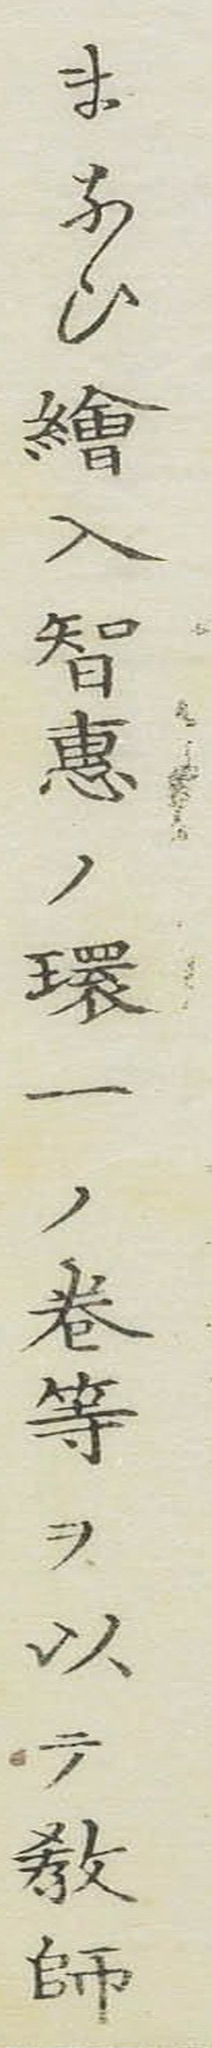まなひ絵入智恵ノ環一ノ巻等ヲ以テ教師
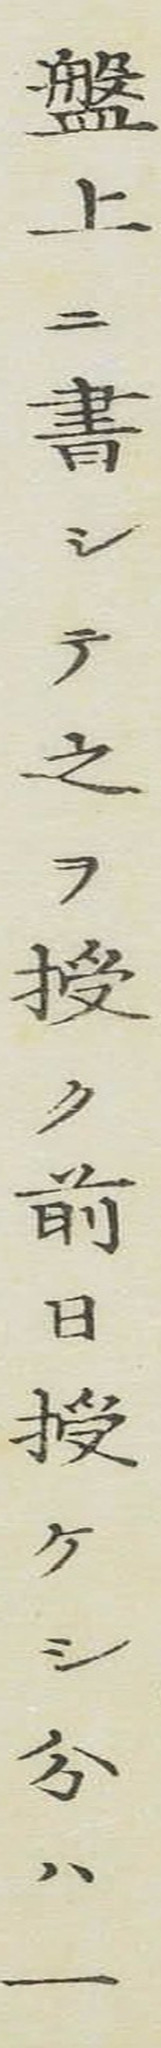盤上ニ書シテ之ヲ授ク前日授ケシ分ハ一
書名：小学教則
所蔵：東京学芸大学教育コンテンツアーカイブ
